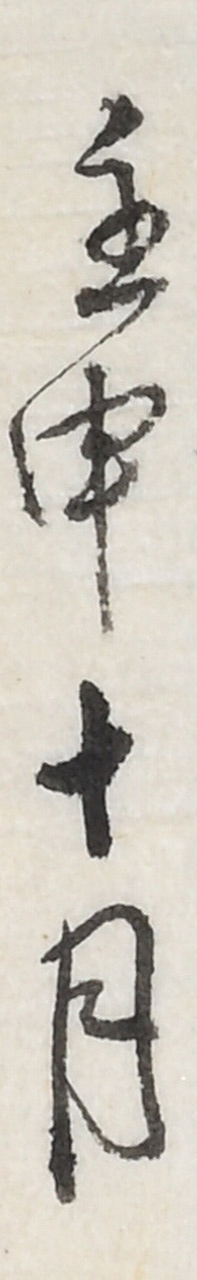壬申十月
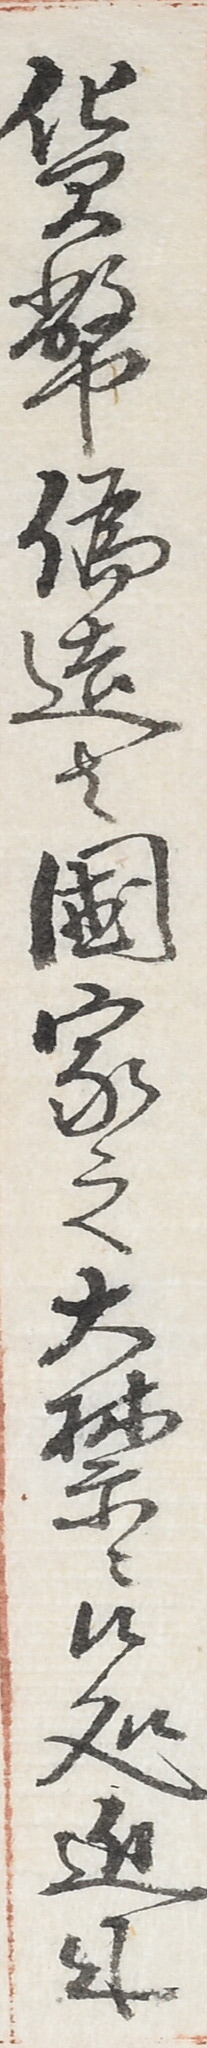貨幣偽造は国家之大禁ニ候処近年
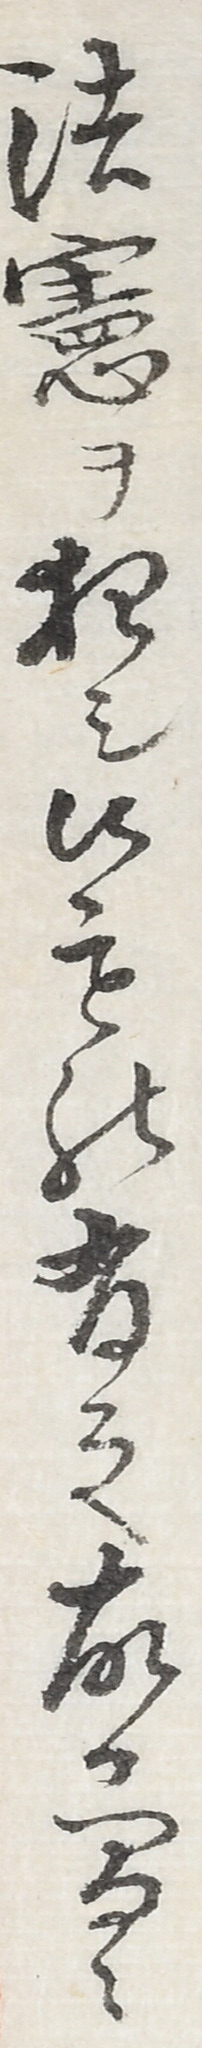法憲ヲ犯シ候もの有之故か間々
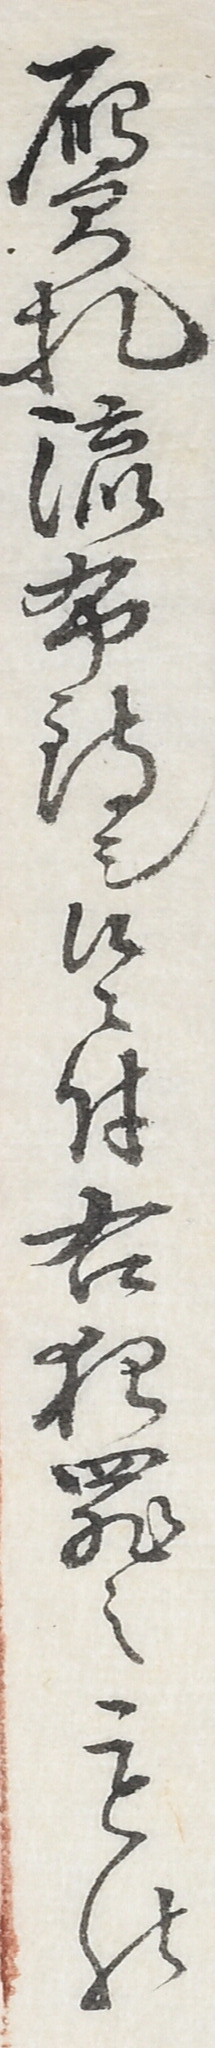贗札流布致シ候ニ付右犯罪之もの
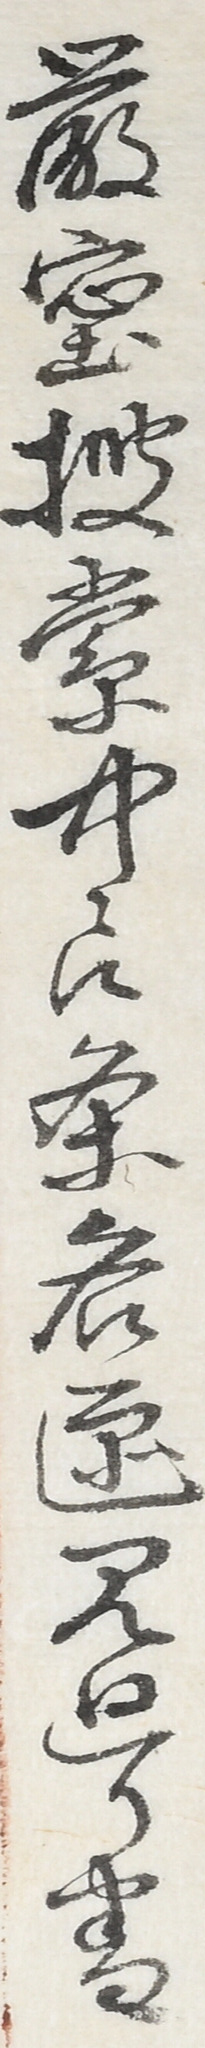厳密捜索中ニ候条各区見廻り番
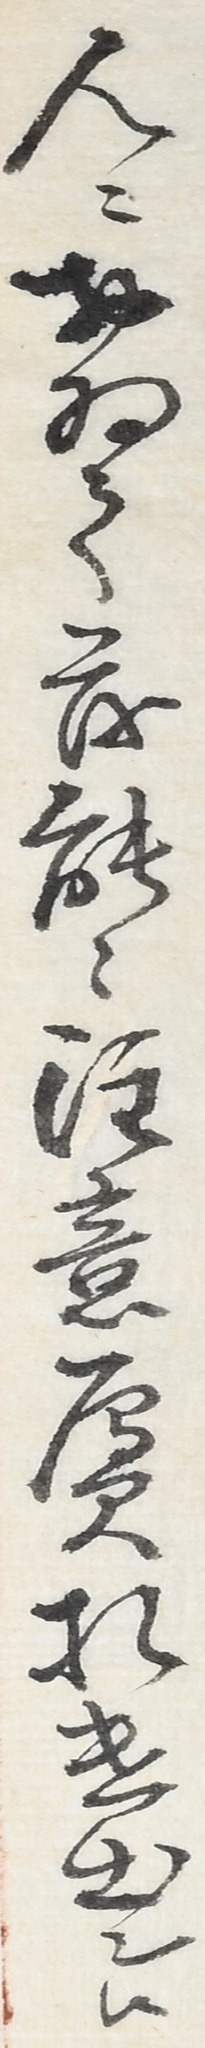人ニおゐても能々注意贗札遣出シ候

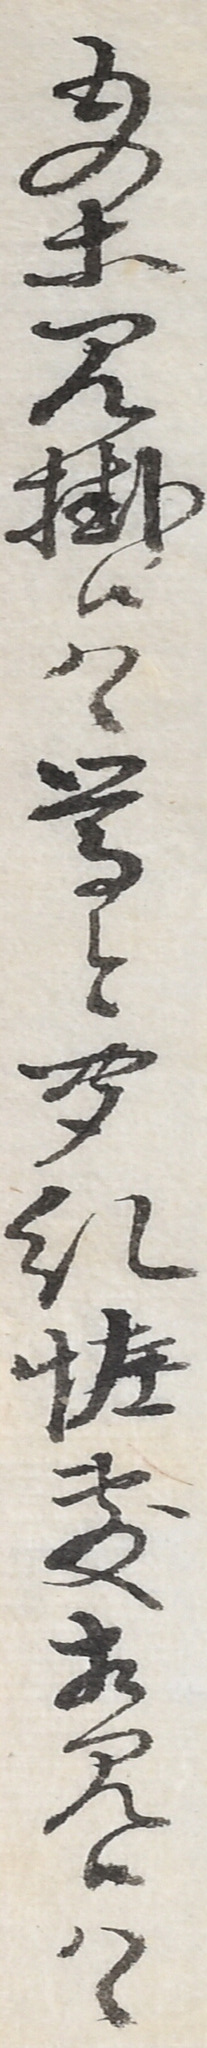もの等見掛候ハヽ篤と聞糺怪敷相見候ハゝ
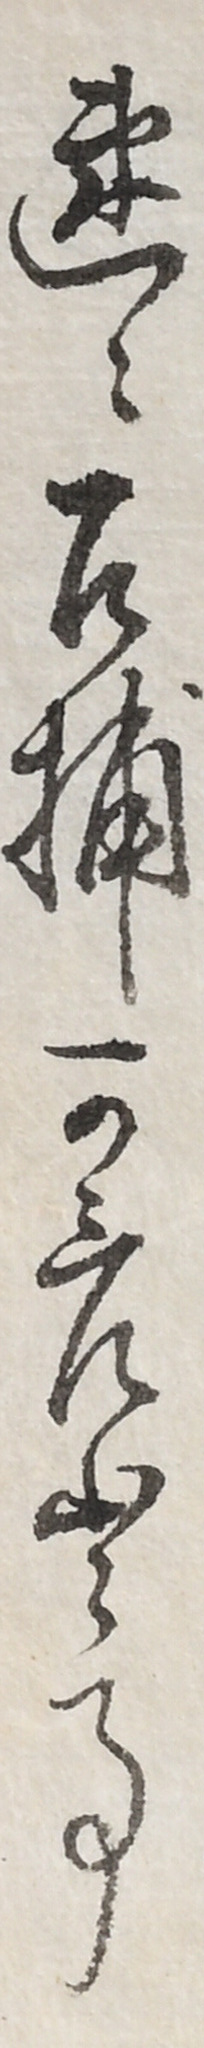速ニ召捕可差出事
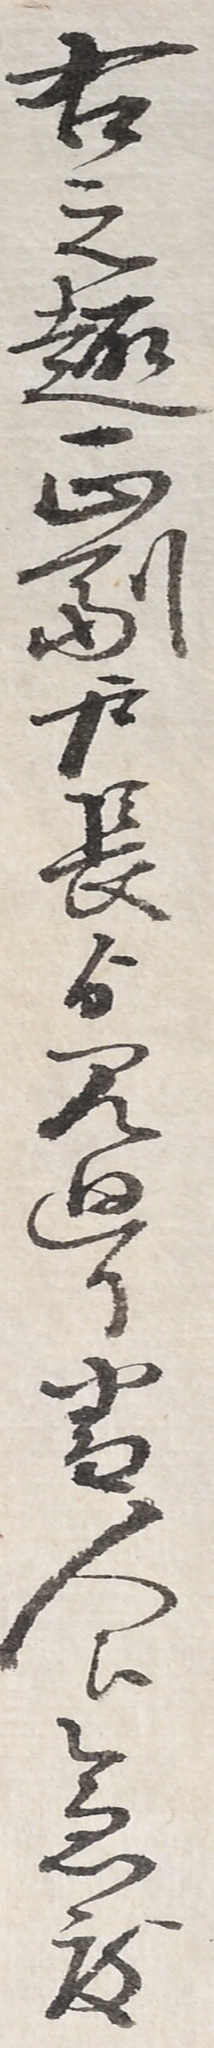右之趣正副戸長より見廻り当人え急度
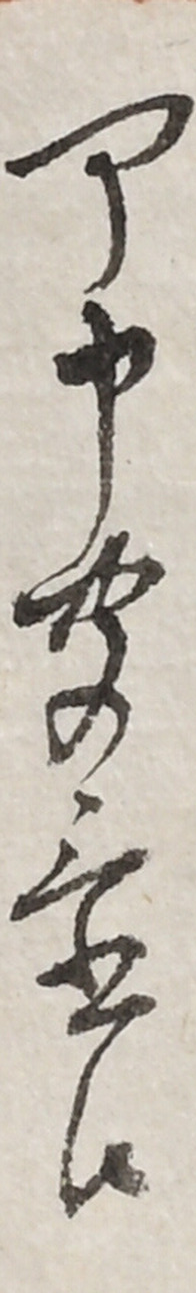可申聞置候
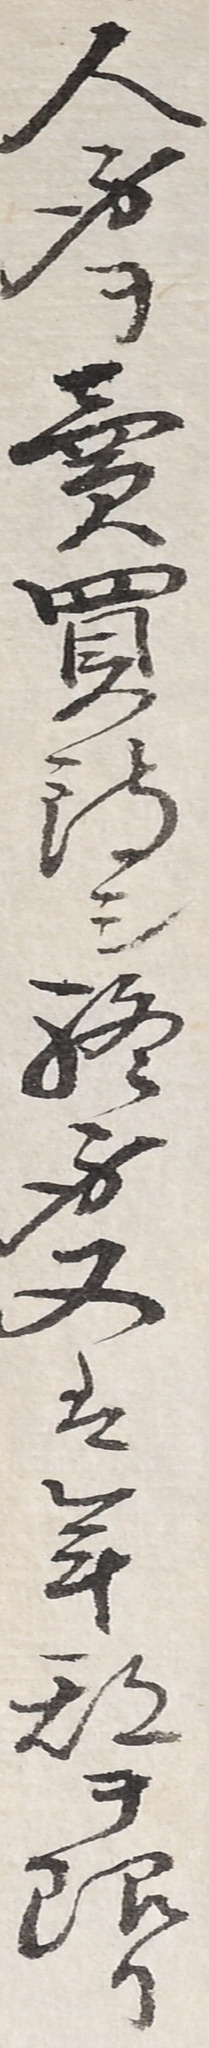人身ヲ売買致シ終身又は年期ヲ限り
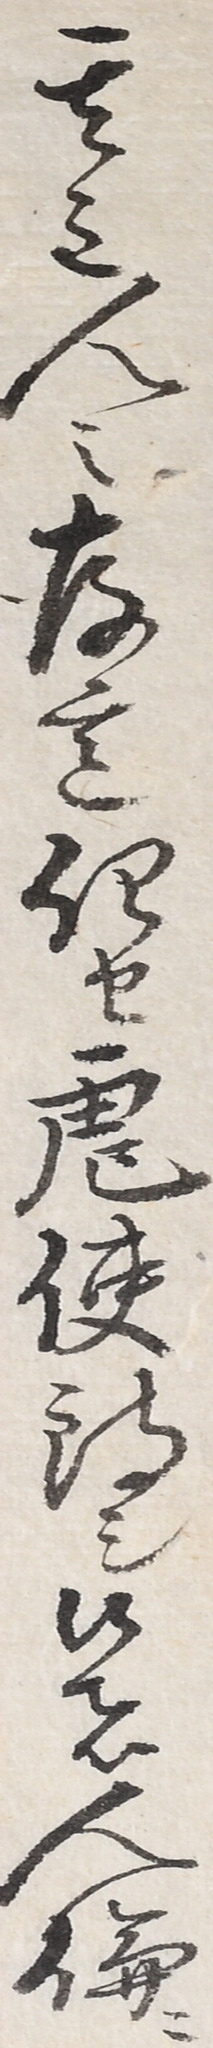其主人之存意任せ虐使致シ候者人倫ニ
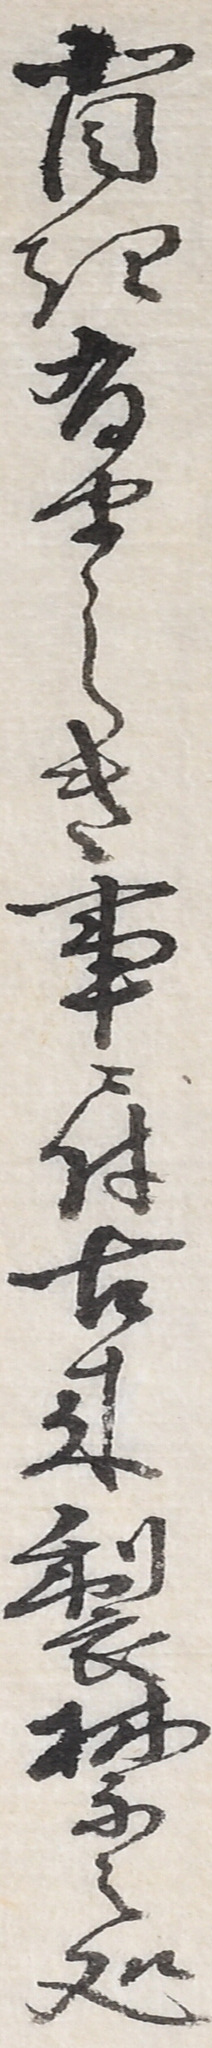背き有ましき事ニ付古来製禁之処
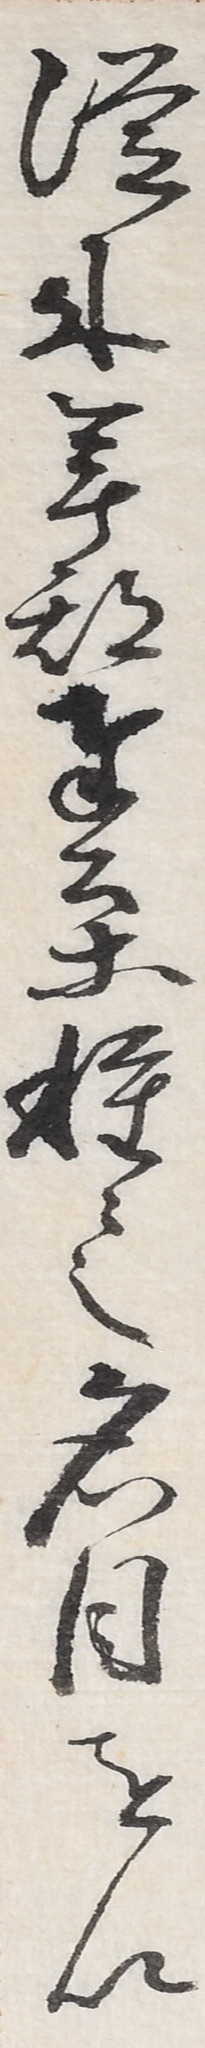従来年期奉公等種々之名目を以
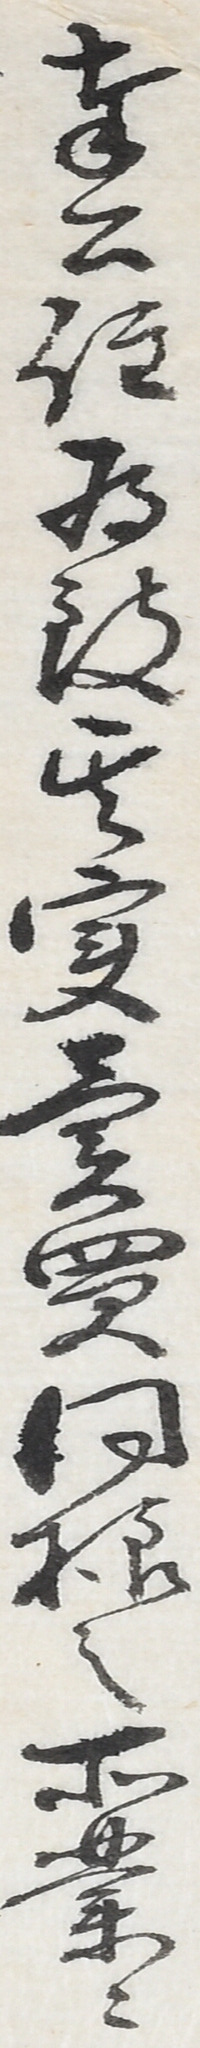奉公住為致其実売買同様之所業ニ
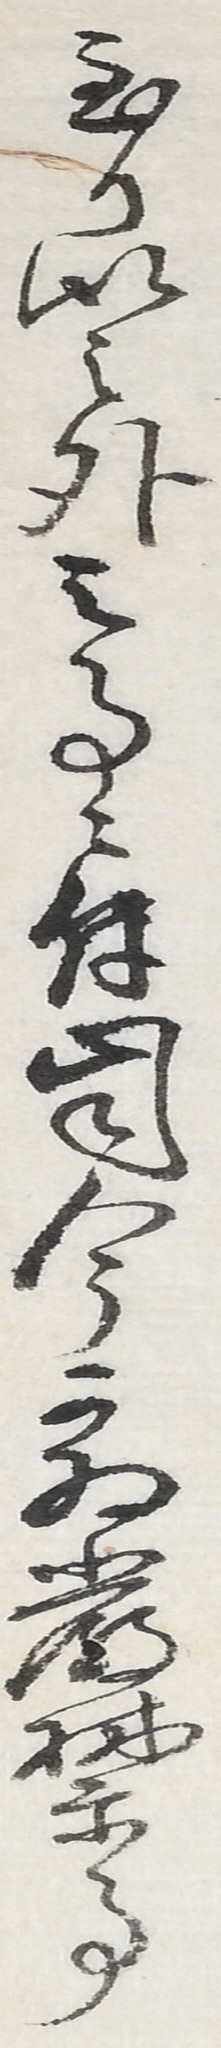至り以之外之事ニ付自今可為厳禁事
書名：壹番・御布告一式
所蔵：伊那市立高遠町図書館・合同会社AMANE
